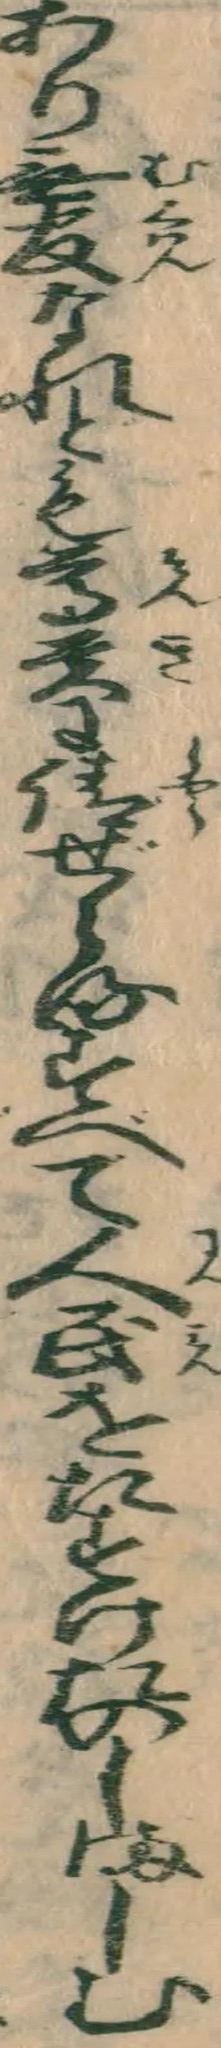あり無官なれとも尊貴に請ぜらるすべて人民をたすけたのしましむ
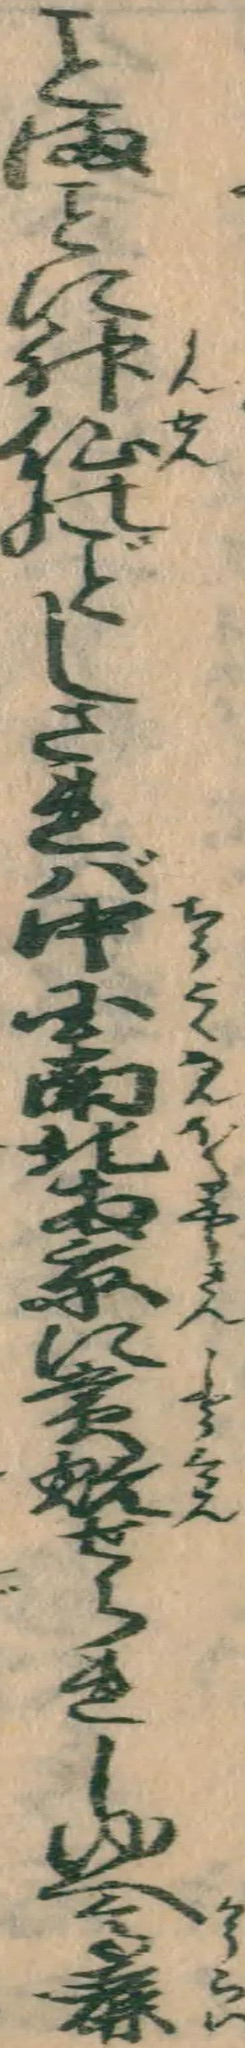ことまことに神仙のごとしされば中国南北両京に賞翫せられしゆへ高麗
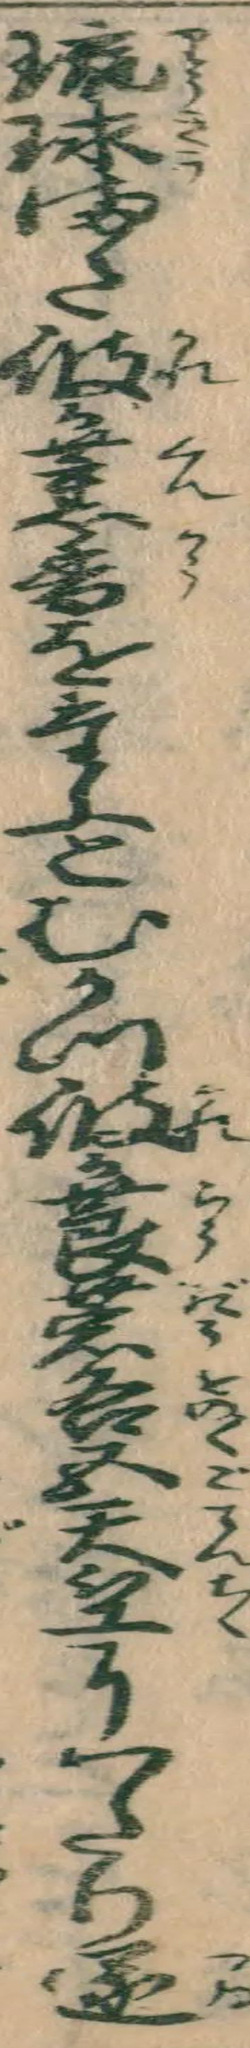琉球また彼か薫香をたふとむかつ彼か莨菪各五天竺にいたり遂
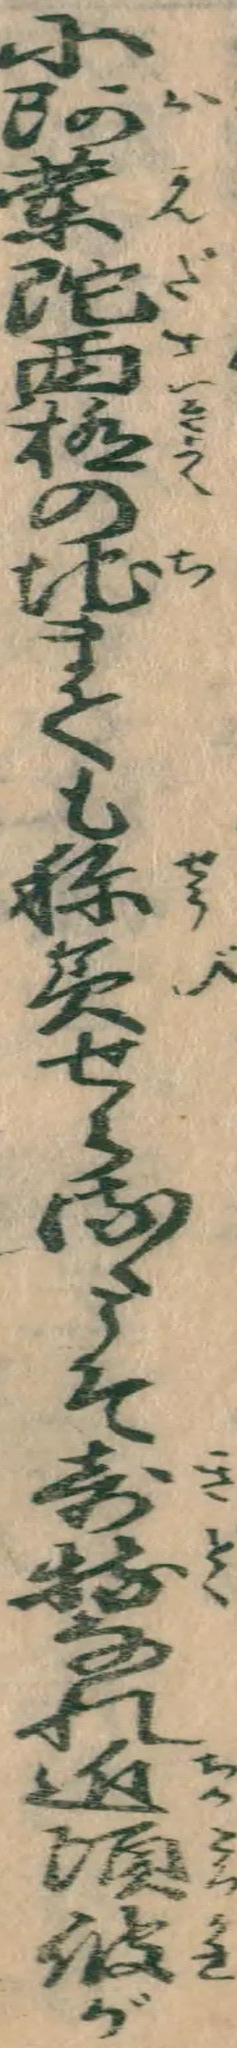に阿蘭陀西極の地まても称美せらるゝこそ奇特なれ近頃彼が
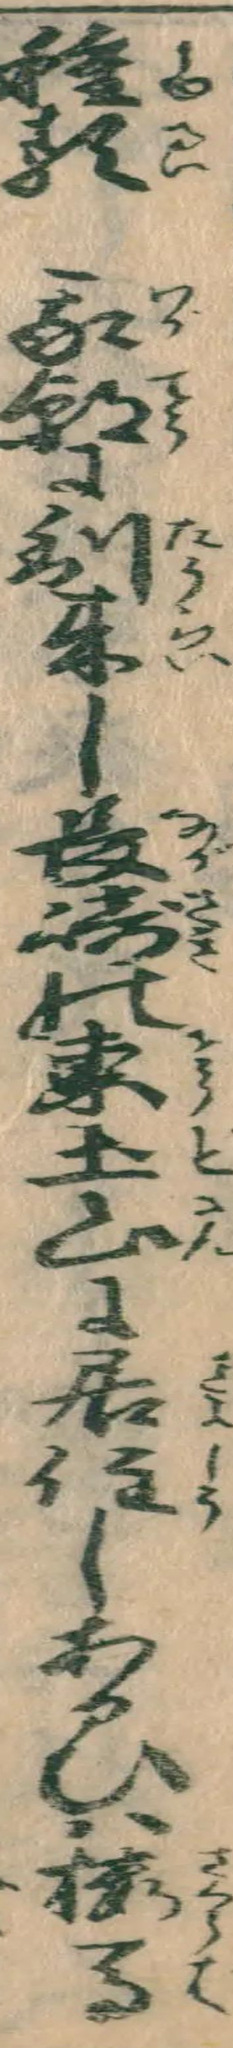種類我朝に到来し長崎の東土山に居住しあるひは桜馬
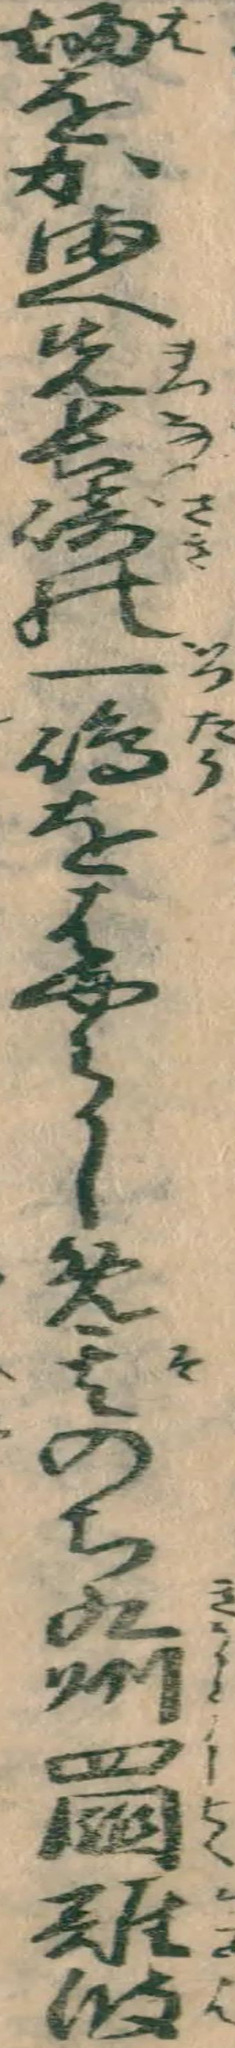場をかまへ先長崎の一島をはやらしめ其のち九州四国難波
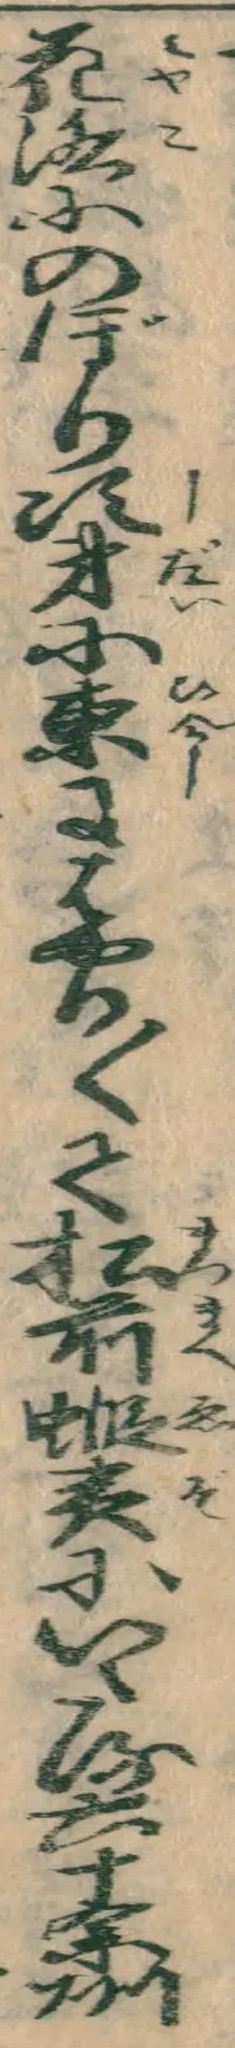花洛にのぼり次第に東にはやり〳〵て松前蝦夷にいたる六十余州
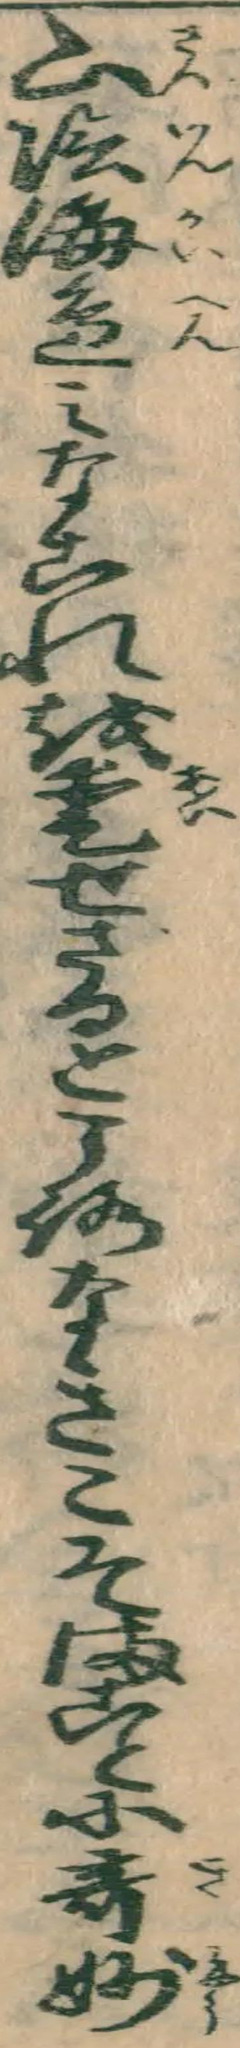山陰海辺みなこれを愛せざるところなきこそまことに奇妙
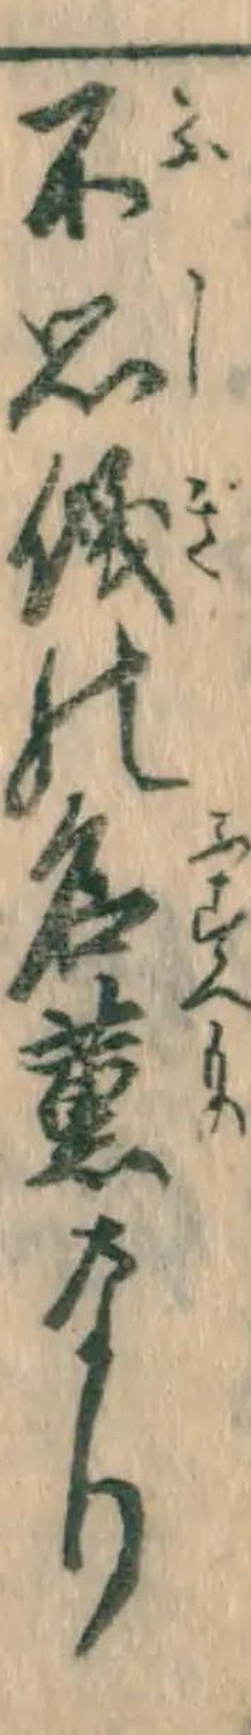不思議の名薫なり

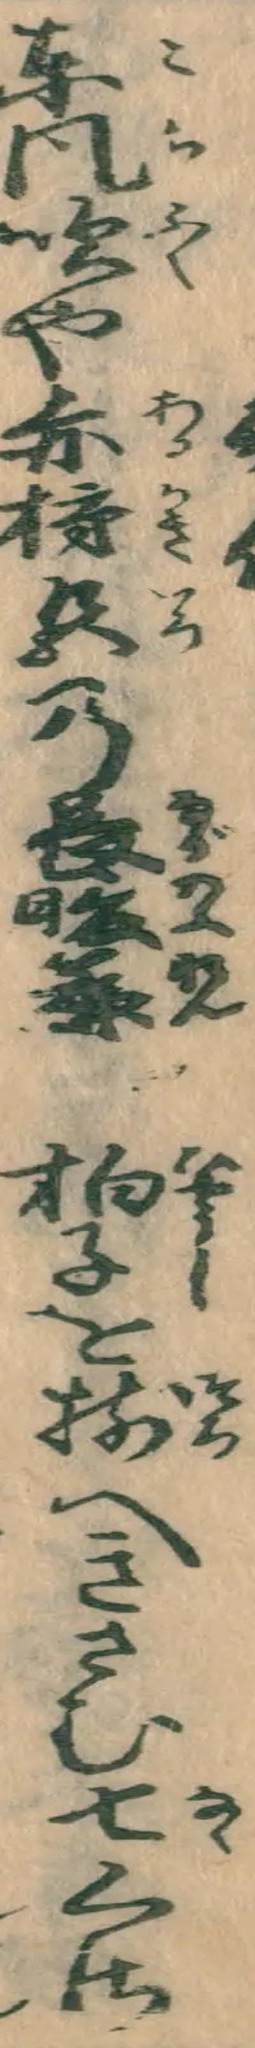東風吹や赤柿色の長暖簾拍子を揃へきさむ七くさ
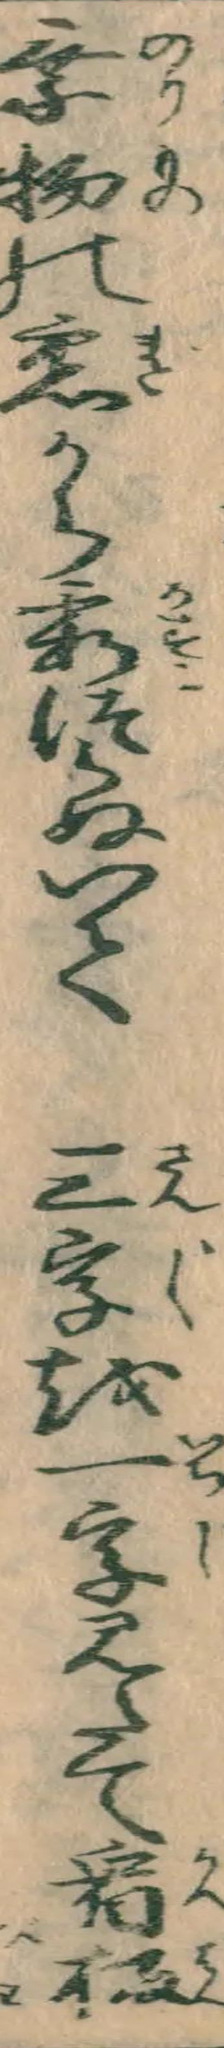乗物の窓から霞つらぬいて三字を一字見たて看板
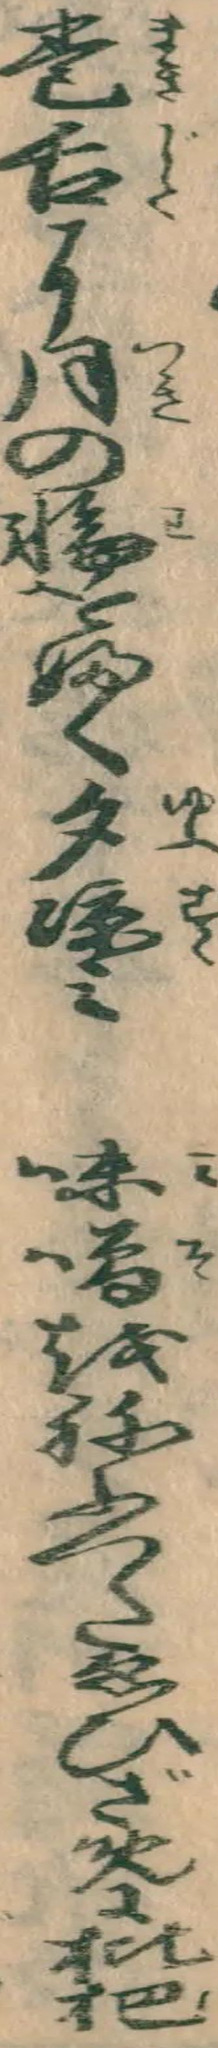巻舌に月の輪をふく夕涼み味噌をねふつたゑひざめに枇杷
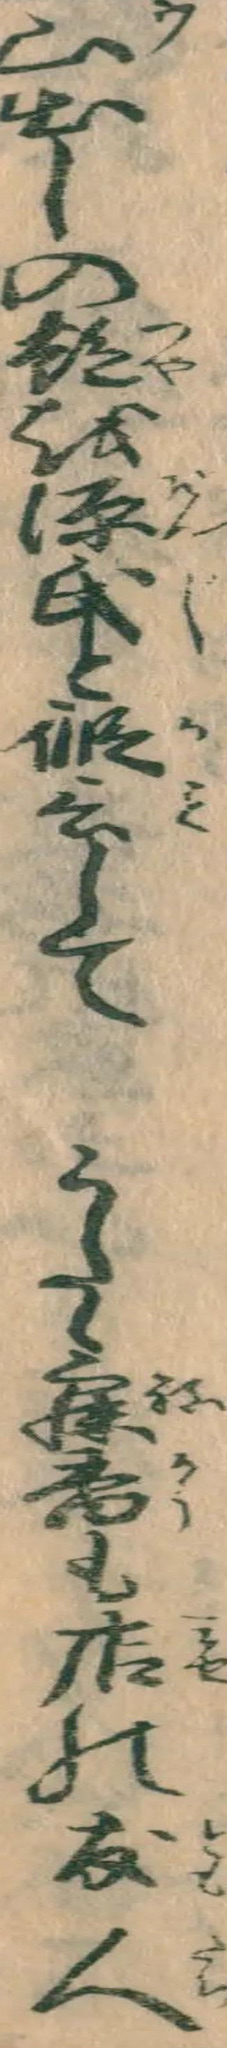山出しの艶を源氏と仮言してうたゝ寐香も店の友人
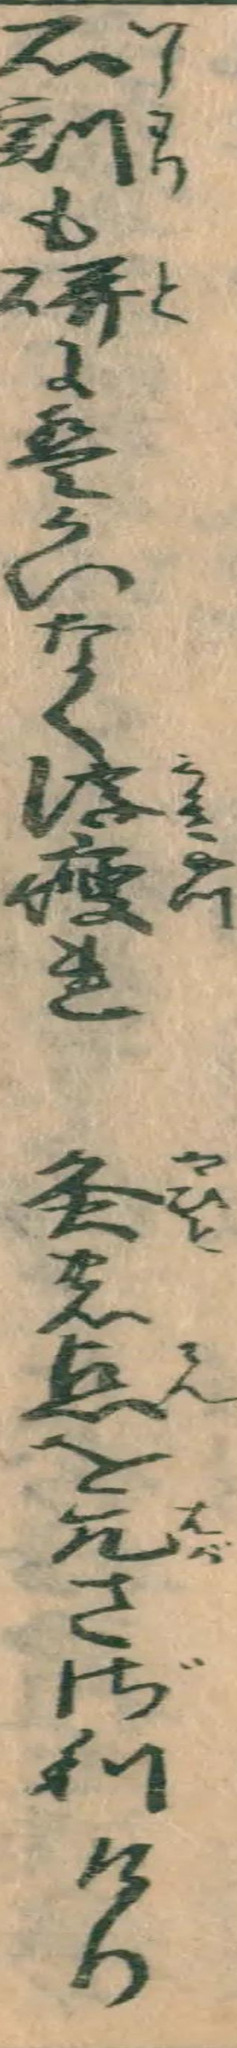石割も研にはかいなく浮痩れ灸の点を兀さざりけり
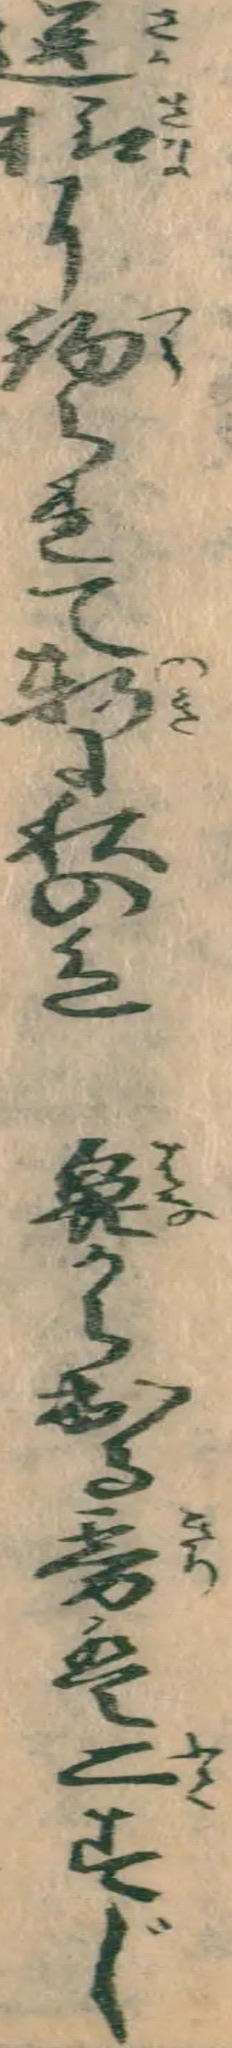逆様に釣られて軒に秋の色鼻から出る霧は二すじ
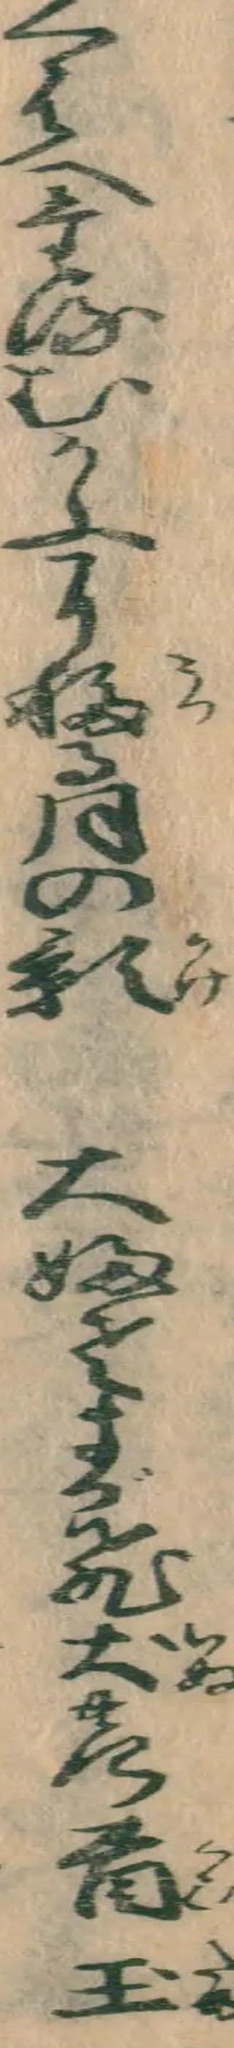くはへたるむかふに移る月の影大ふさまがひ犬の首玉
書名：煙草記
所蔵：国立国会図書館 National Diet Library, JAPAN
